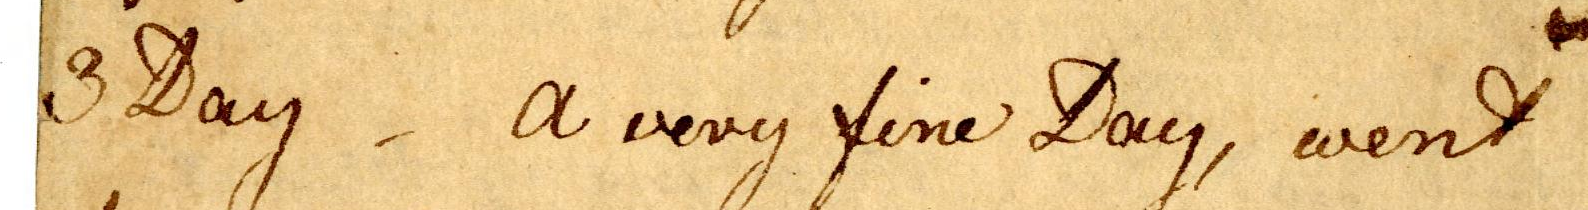3 Day- A very fine Day, went
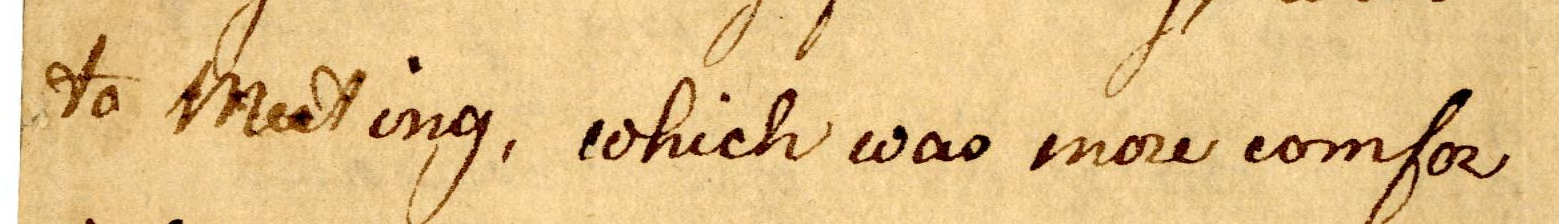to Meeting, which was more comfor
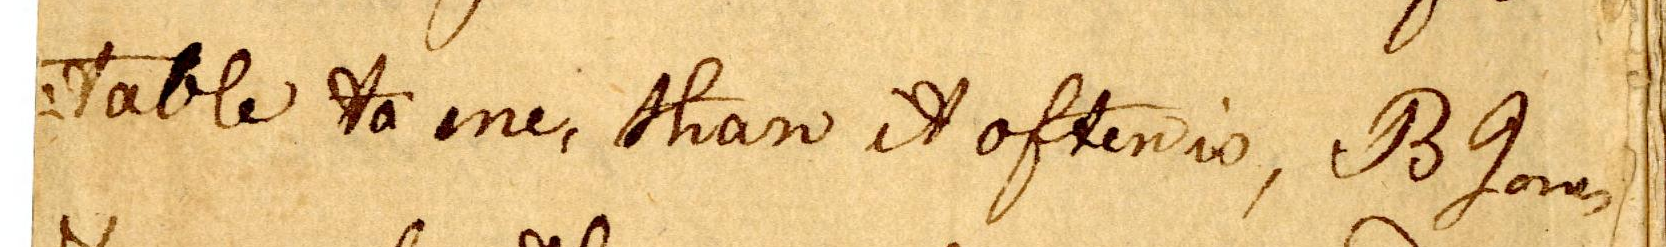-table to me, than it often is, B Jones,
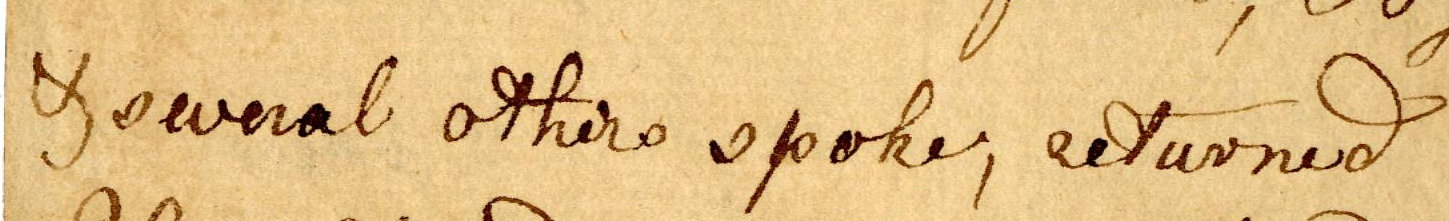& several others spoke, returned
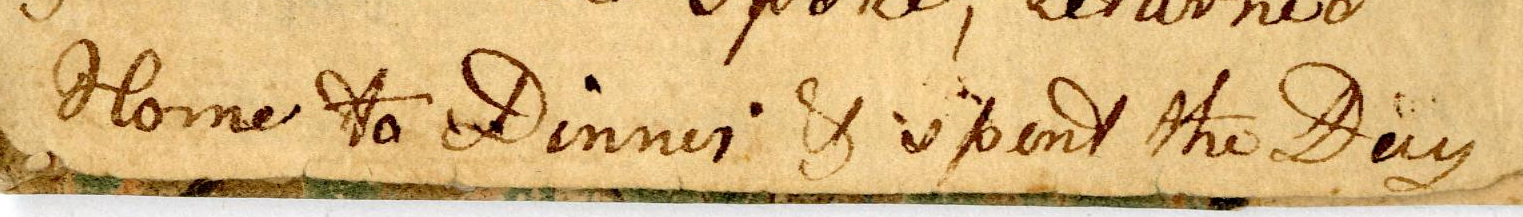Home to Dinner & spent the Day
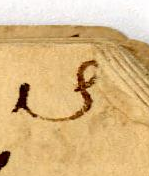3
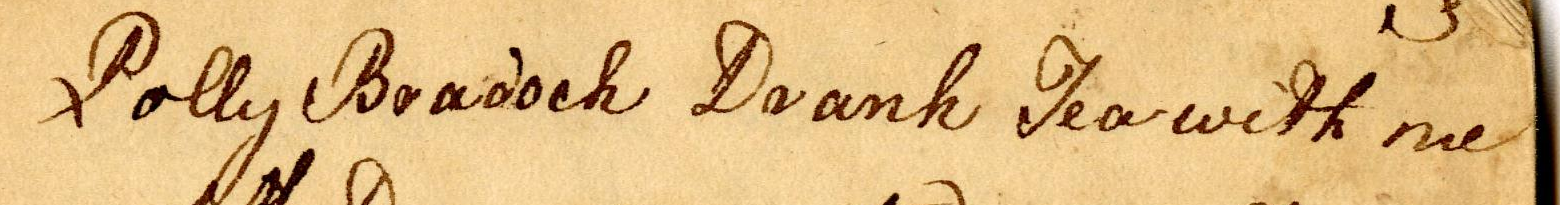Polly Bradock Drank Tea with me
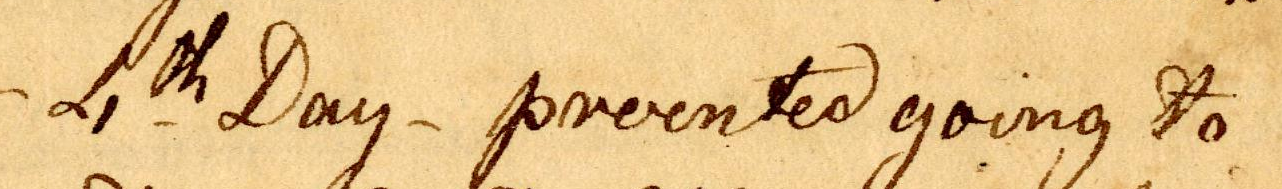4^th Day- prevented going to
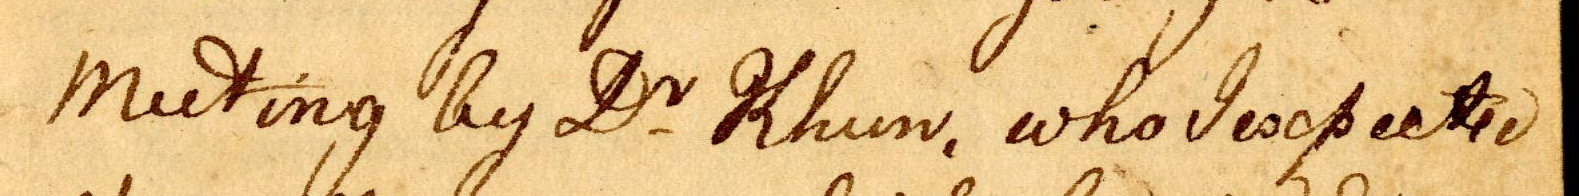Meeting by D^r Khun, who I expected
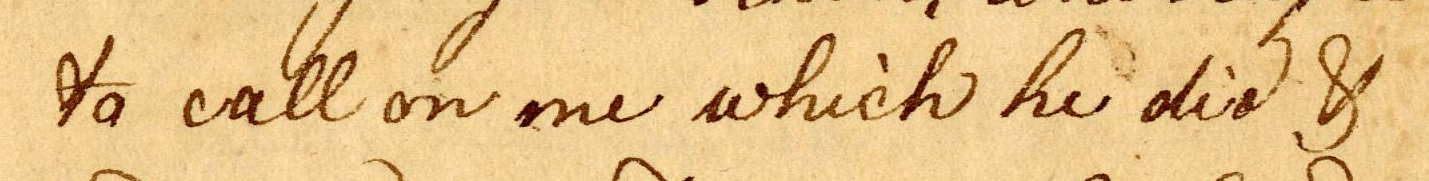to call on me which he did &
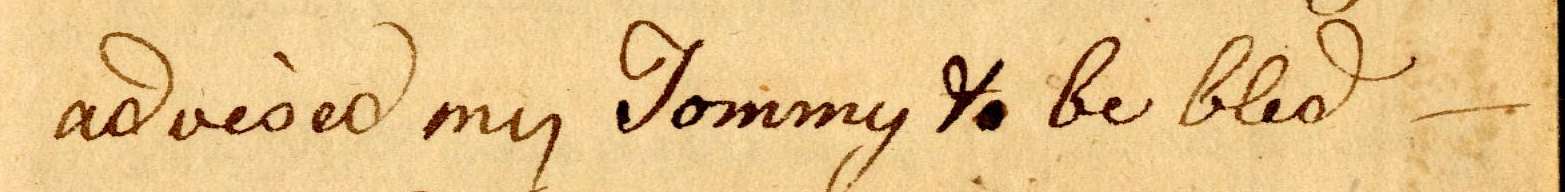advised my Tommy to be bled
